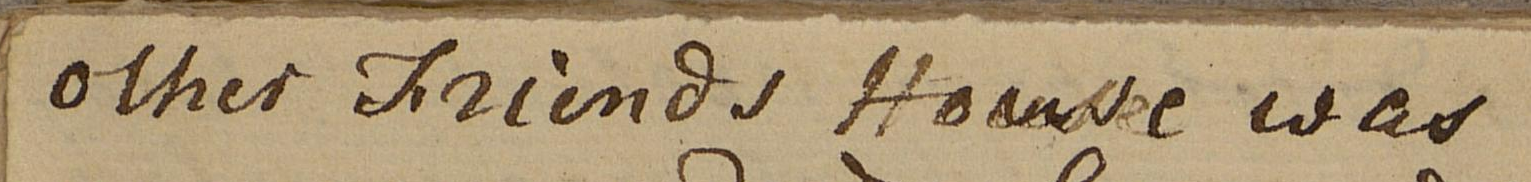other Friends House was
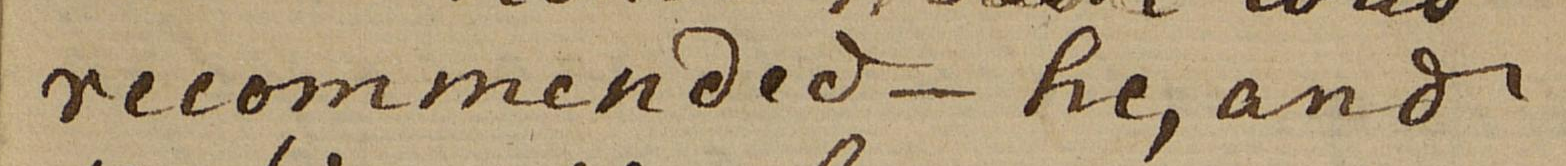recommended- he, and
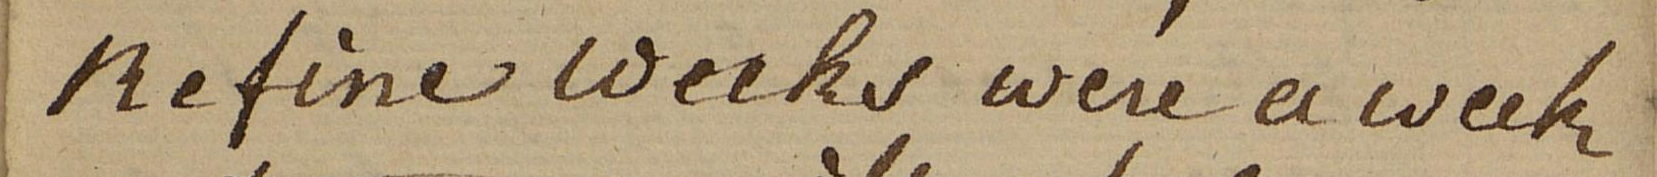Refine Weeks were a week
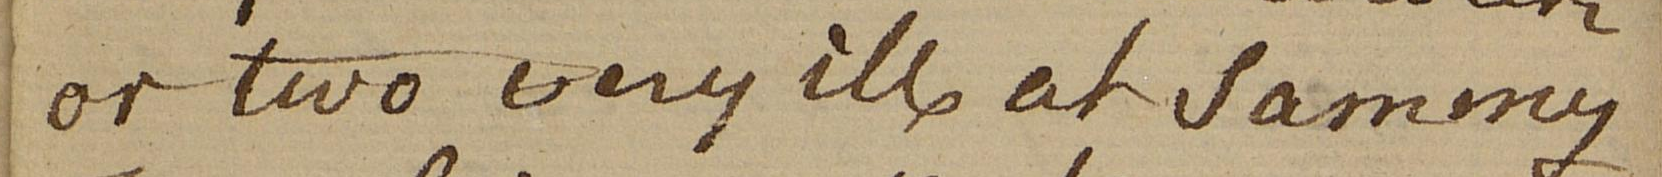or two very ill at Sammy
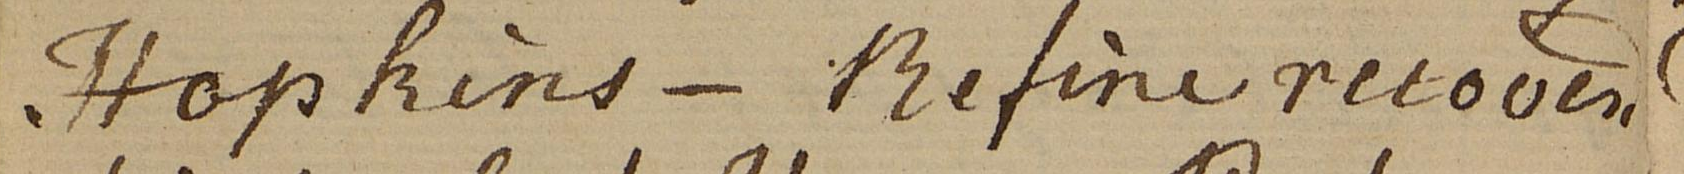Hopkins- Refine recoverd
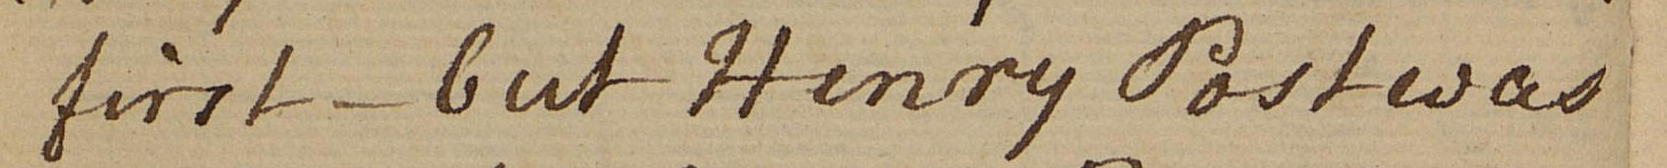first- but Henry Post was
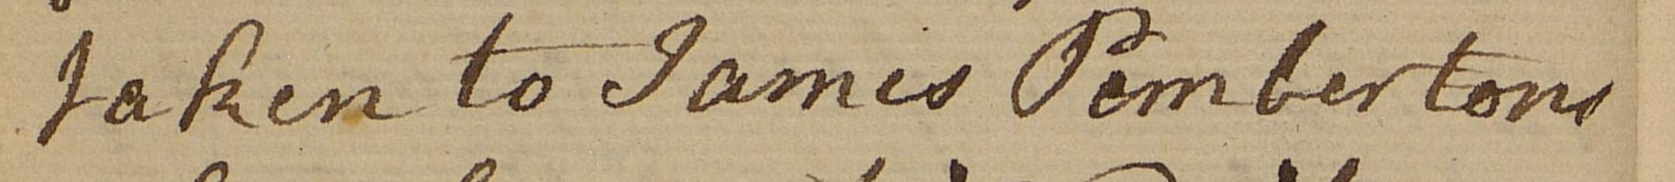taken to James Pembertons
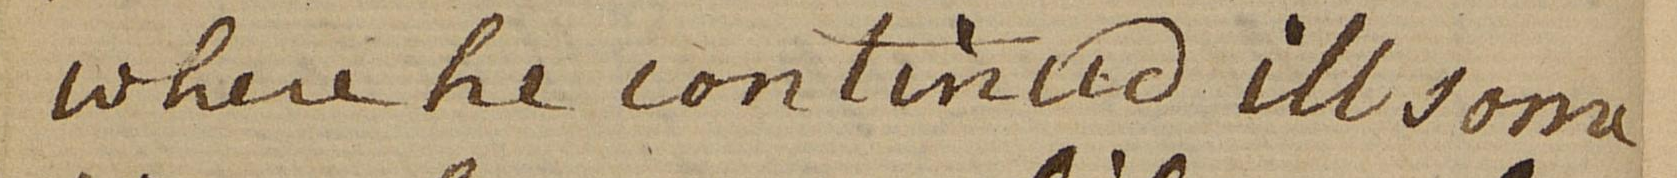where he continued ill some
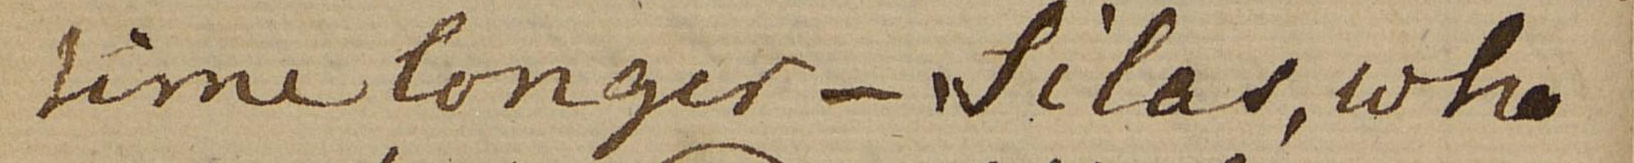time longer- Silas, who
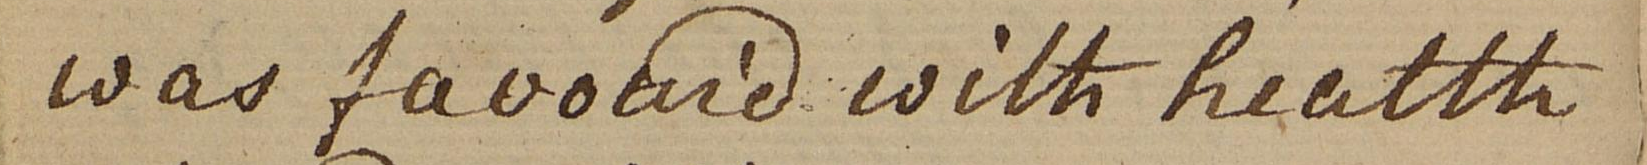was favour'd with heatth
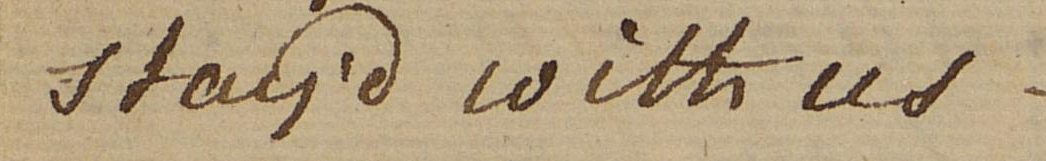Stay'd with us
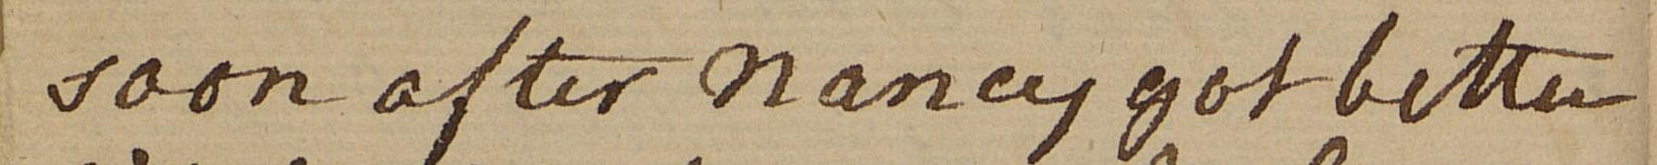soon after Nancy got better
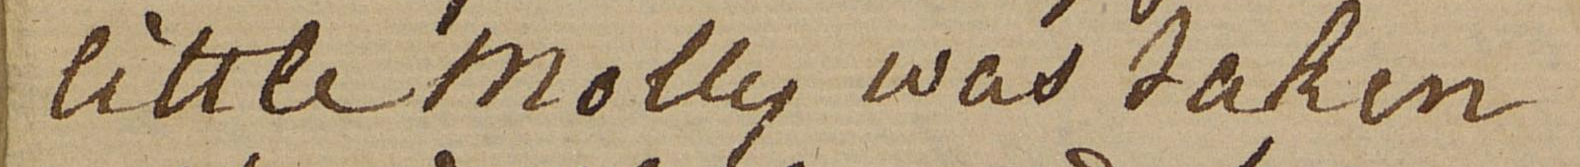little Molly was taken
